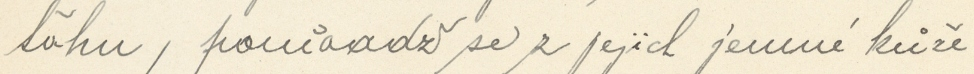tohu, poněvadž se z jejich jemné kůže
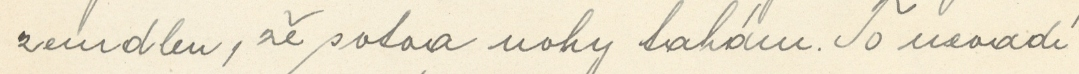zemdlen, že sotva nohy tahám. To nevadí
